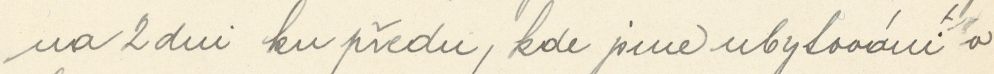na 2 dni ku předu, kde jsme ubytováni v
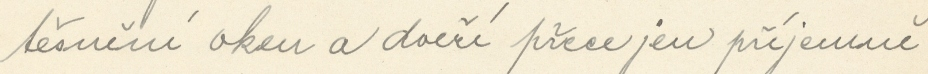těsnění oken a dveří přece jen příjemně
